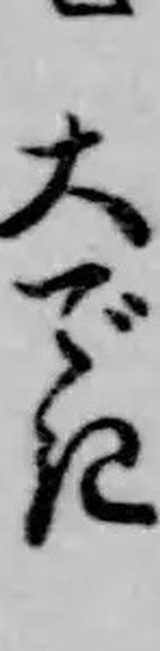大でき

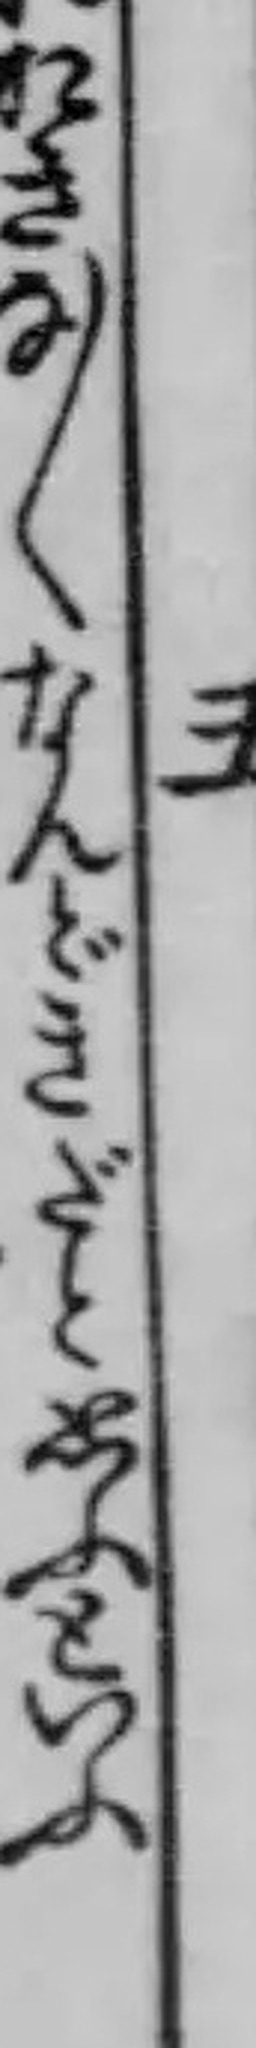これおきな〳〵なんどきだと思ふといふ
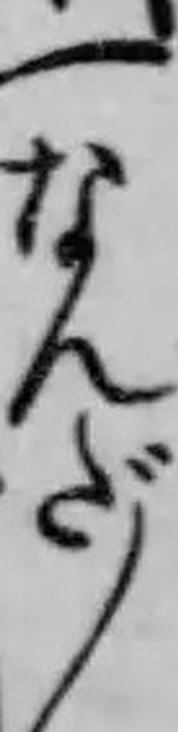なんだ
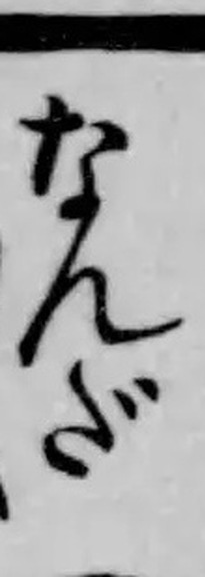なんだ
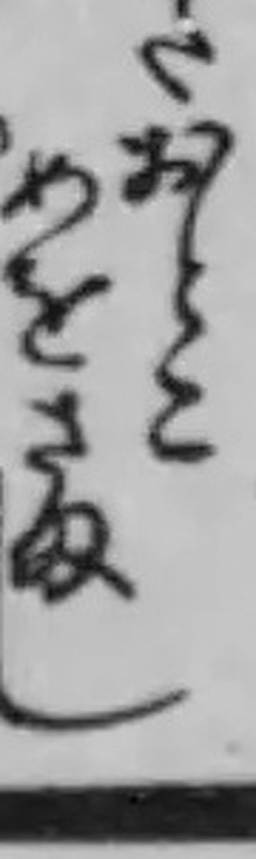めをさまし
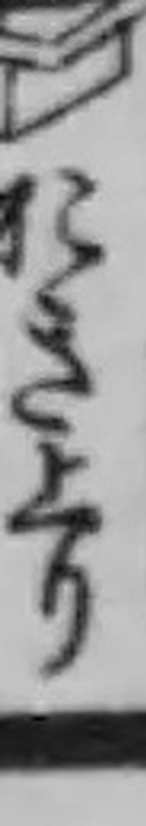おき上り
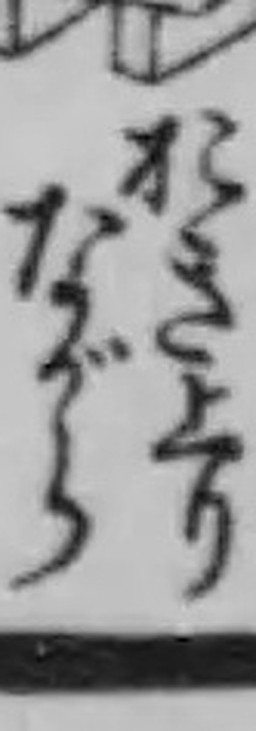ながら
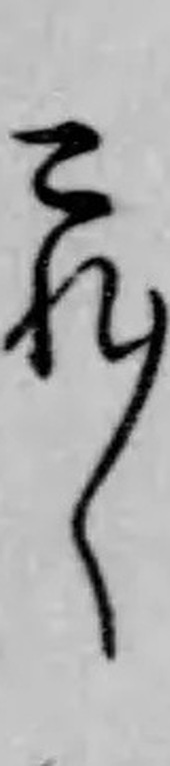これ〳〵
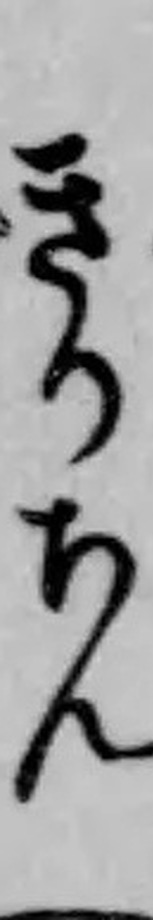きりちん
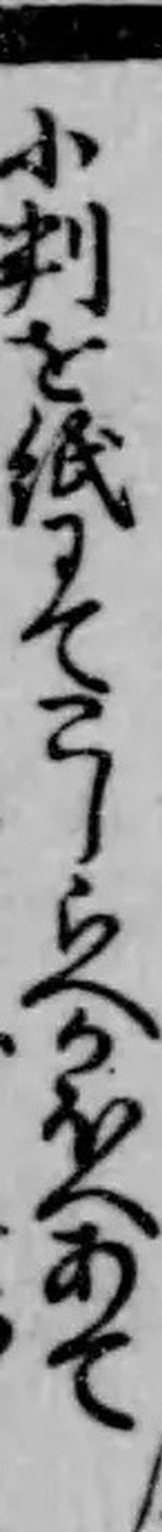小判を髪紙にてこしらへかほへあて
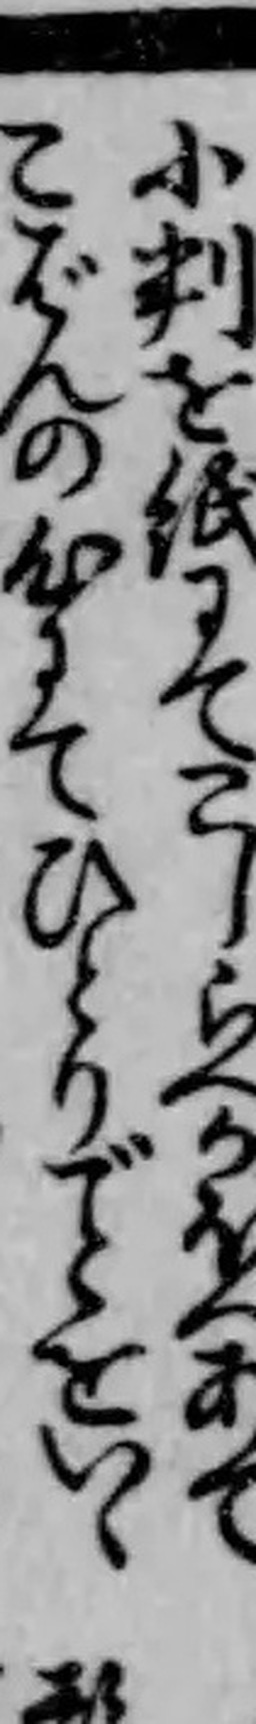こばんの心にてひとりごとをいゝ
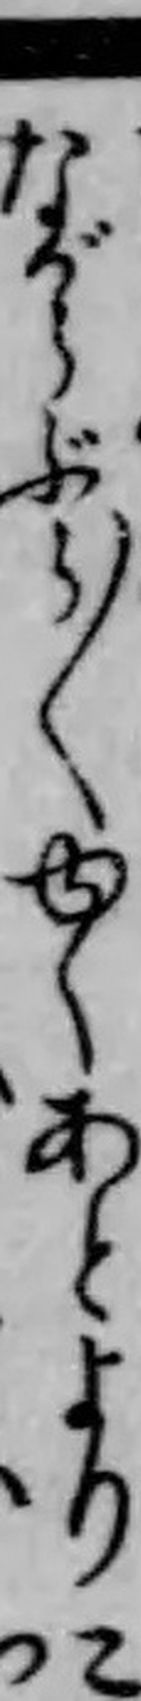ながらぶら〳〵ゆくあとより
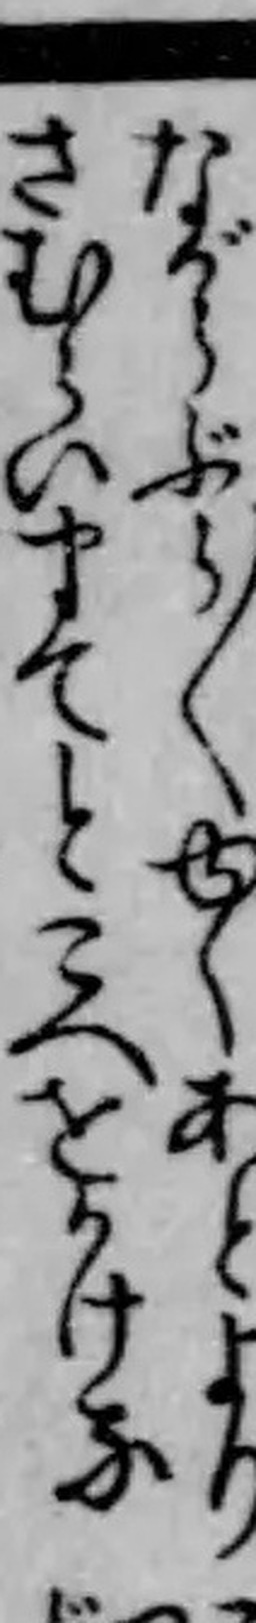さむらいまてとこへをかけな
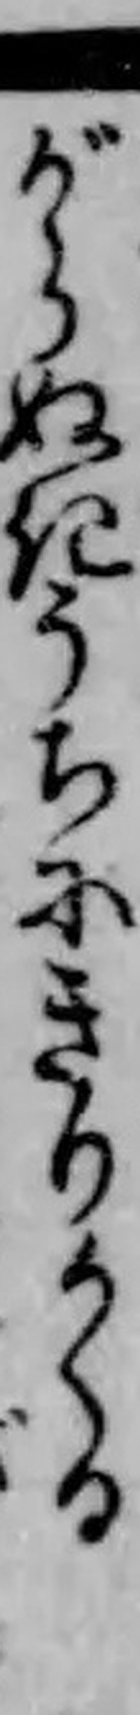がらぬきうちにきりかくる
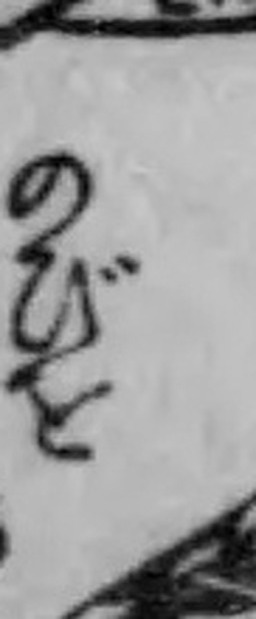のびを
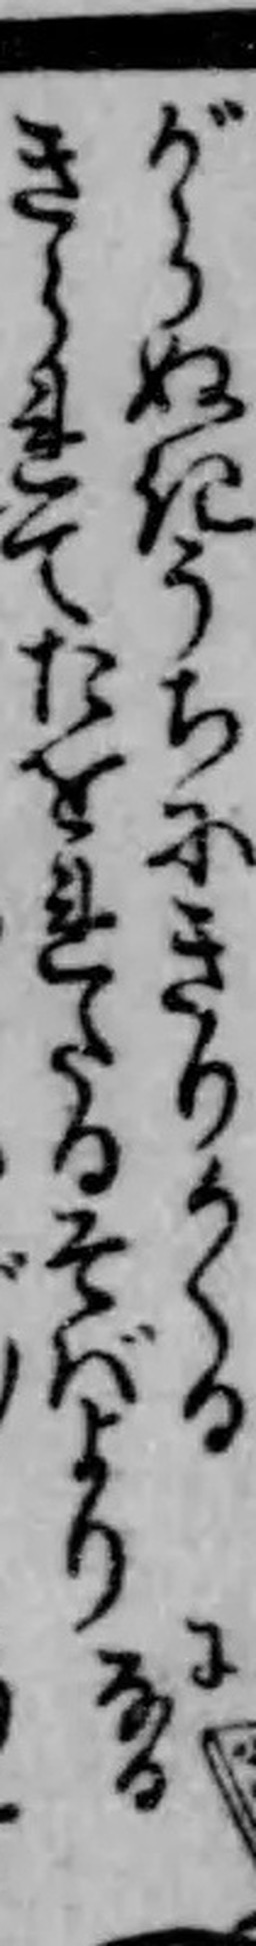きられてたをれたるそばより
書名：明月余情. 第1編
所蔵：国立国会図書館 National Diet Library, JAPAN
